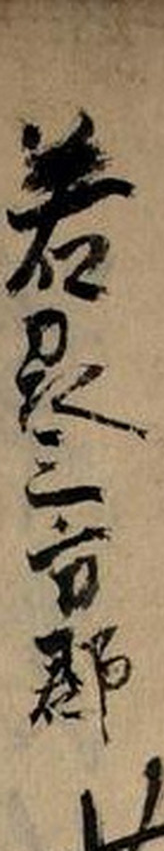若州三方郡
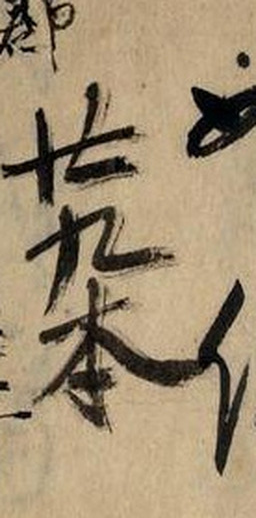廿九本
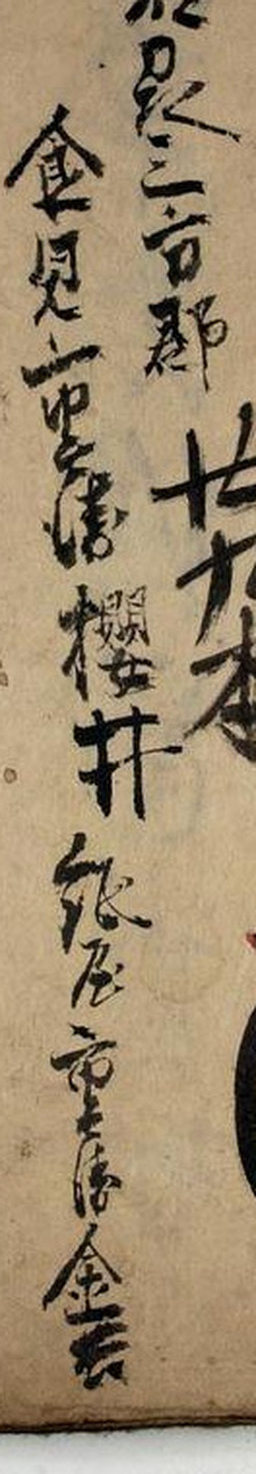食見市兵衛桜井紙屋市兵衛金吉
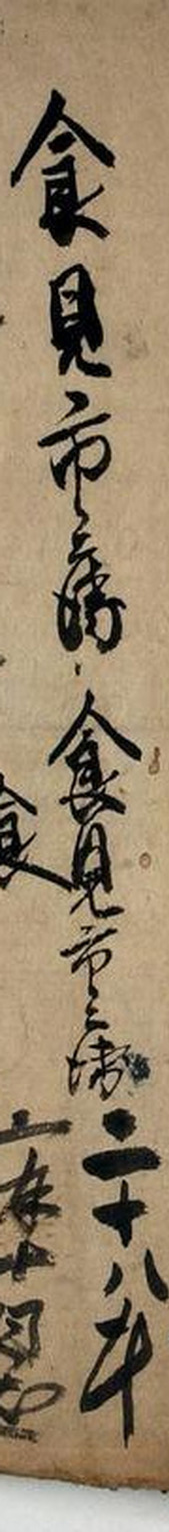食見市兵衛食見市兵衛二十八本
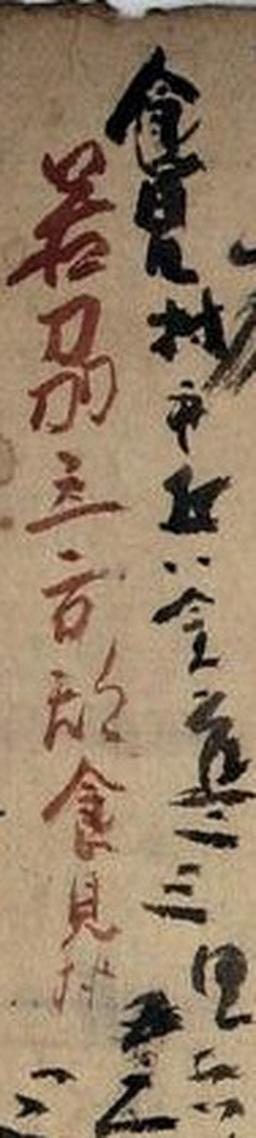「若州三方郡食見村」
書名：商売往来（往来物、手習手本）
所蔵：福井県文書館 Fukui Prefectural Archives
